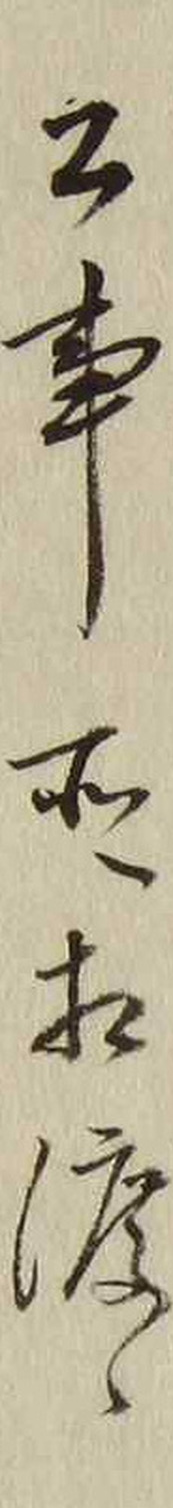公事所へ相渡候
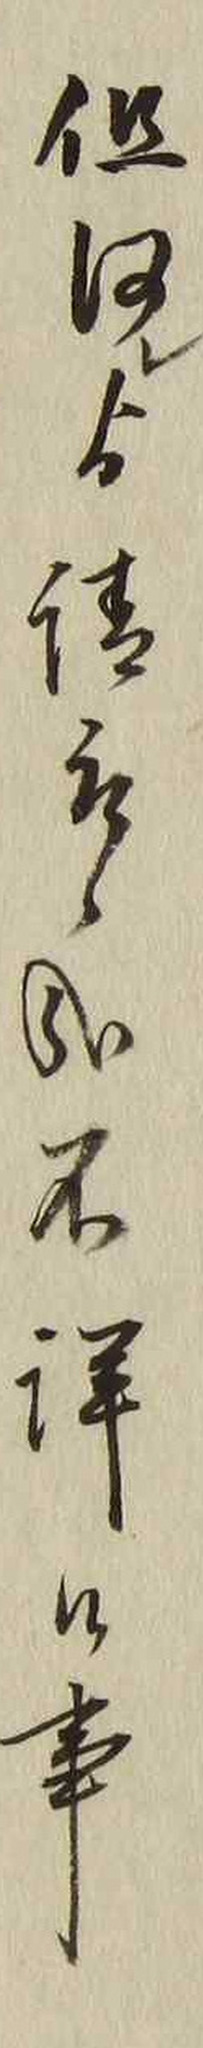但何レゟ請取候哉不詳候事
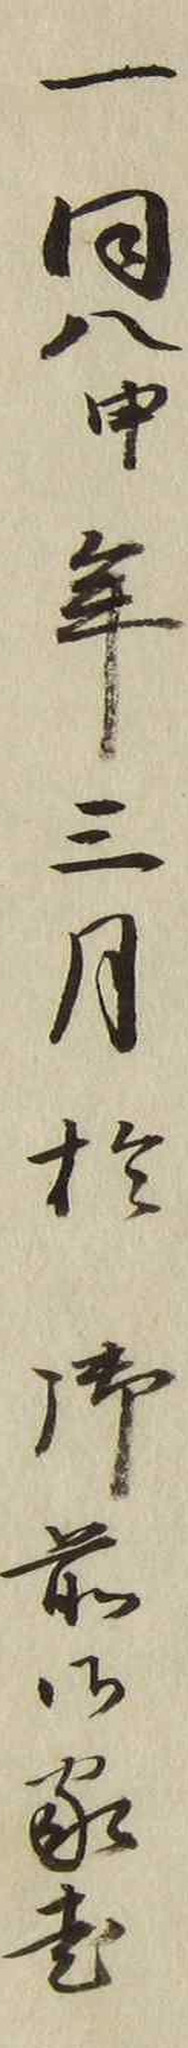一同八申年三月於御前御家老
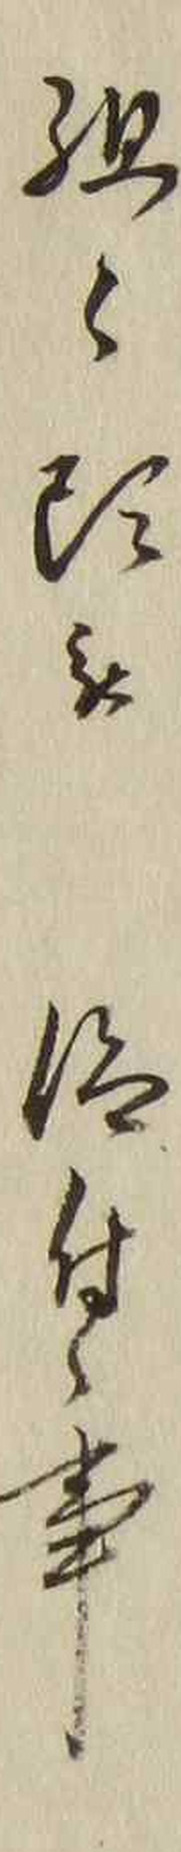組々頭被仰付候事

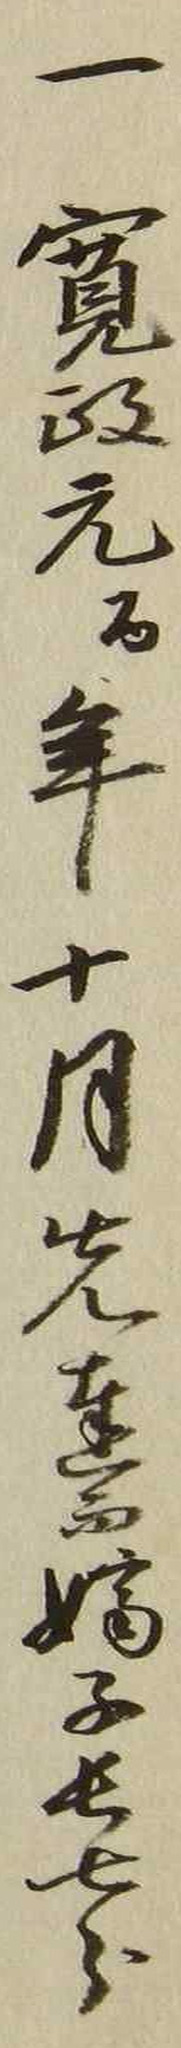一寛政元酉年十月先達而嫡子長七郎
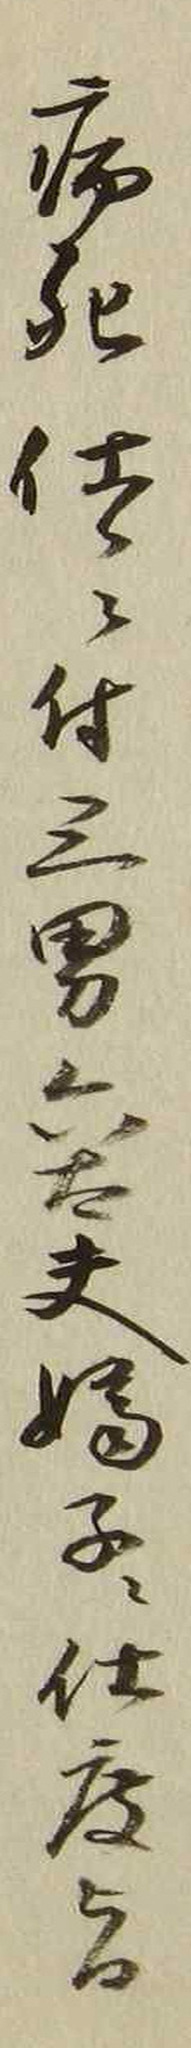病死仕候ニ付三男六太夫嫡子ニ仕度旨
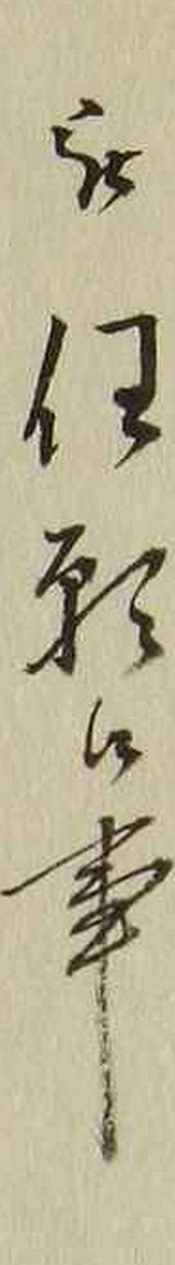被任願候事
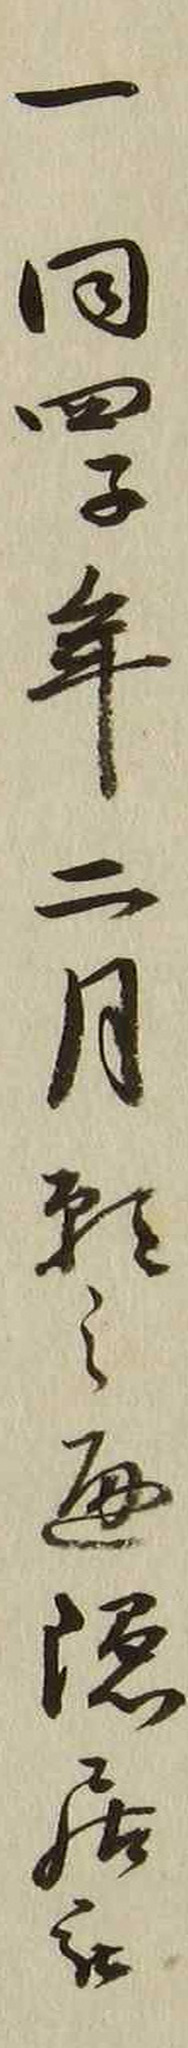一同四子年二月願之通隠居被
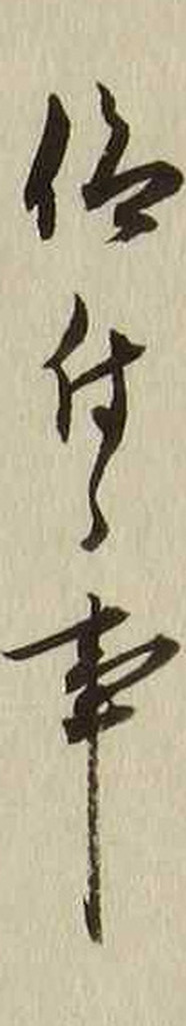仰付候事
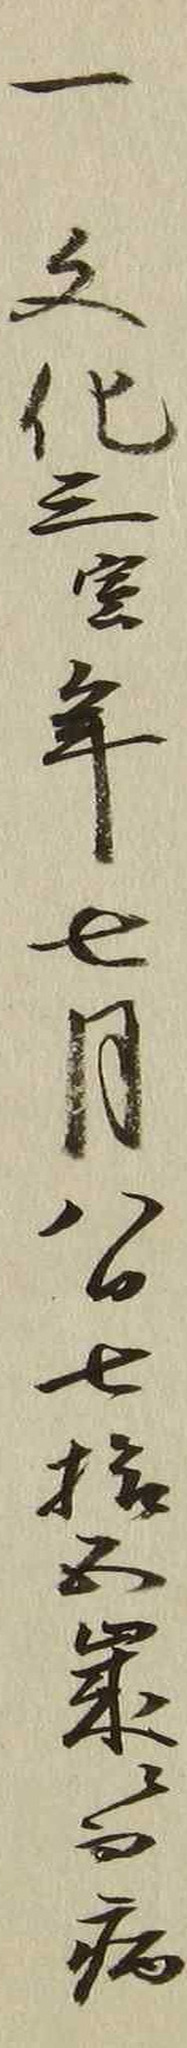一文化三寅年七月八日七拾五歳ニ而病
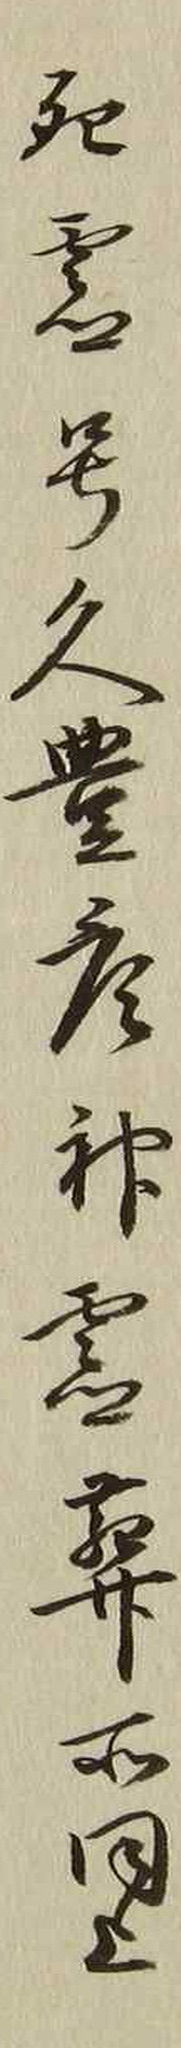死霊号久豊彦神霊葬所同上
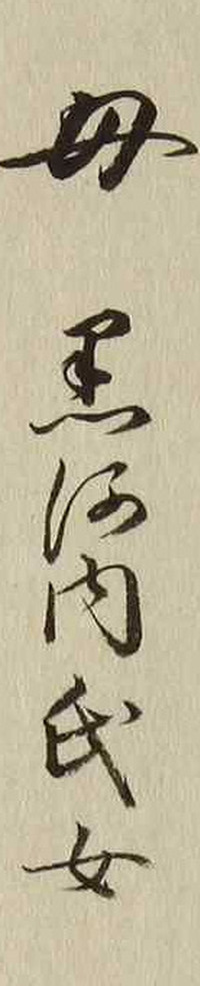母黒河内氏女
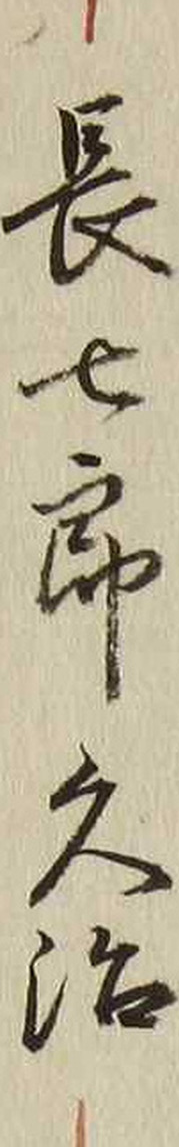長七郎久治
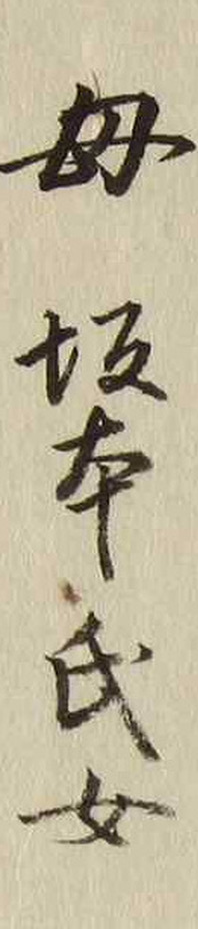母坂本氏女
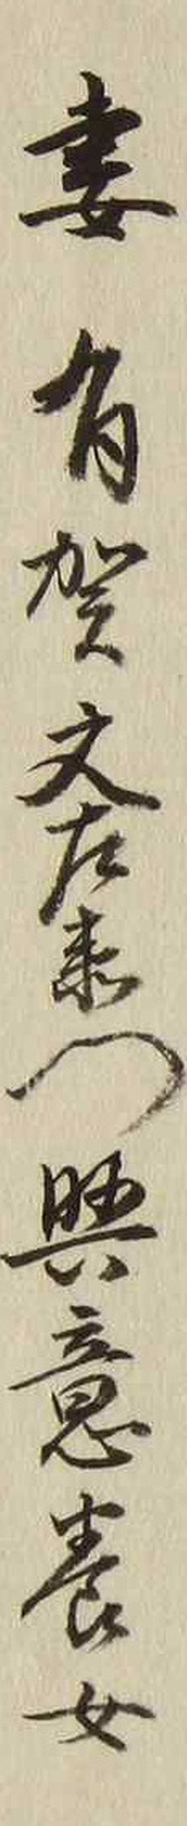妻有賀文左衛門興意養女
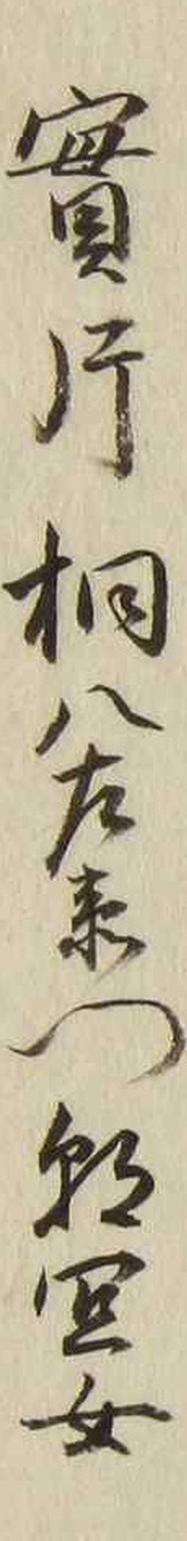実片桐八左衛門朝宜女
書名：諸士系譜　巻之69　を之部3
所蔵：会津若松市立会津図書館
